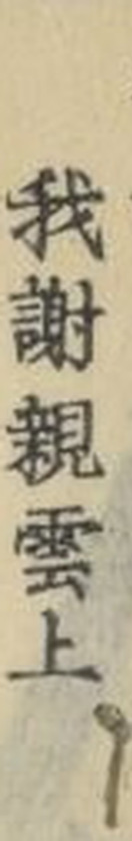我謝親雲上
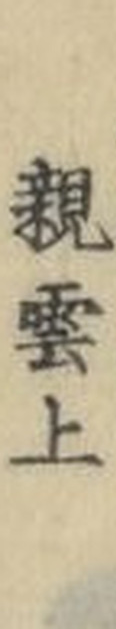親雲上

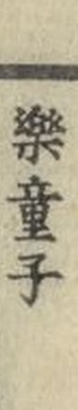楽童子
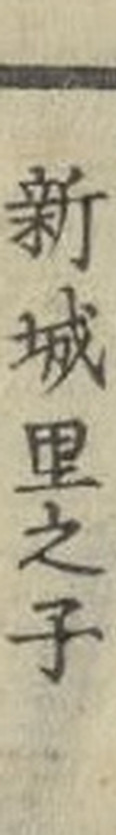新城里之子
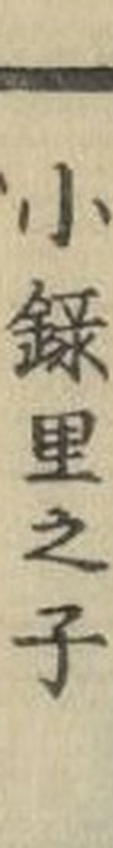小録里之子
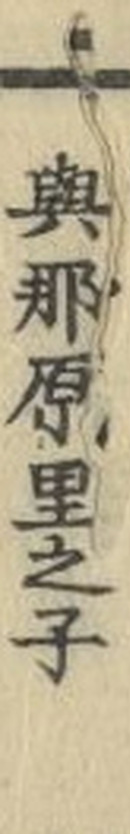與那原里之子
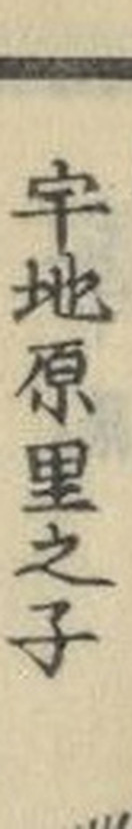宇地原里之子
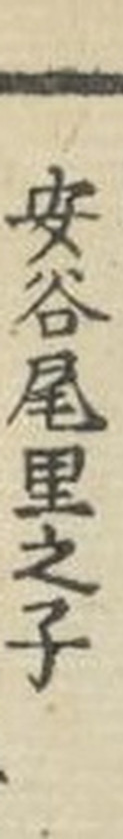安谷尾里之子
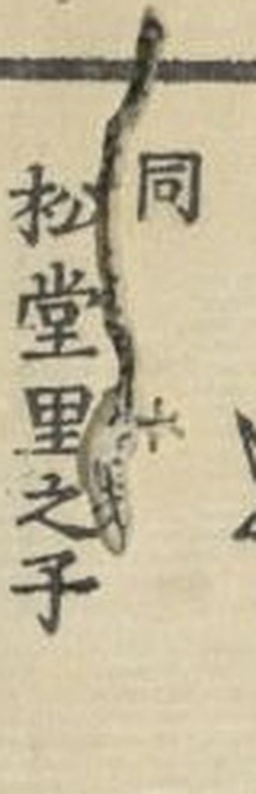松堂里之子
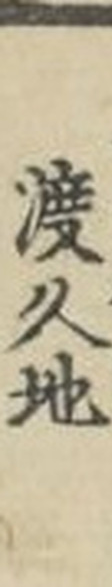渡久地
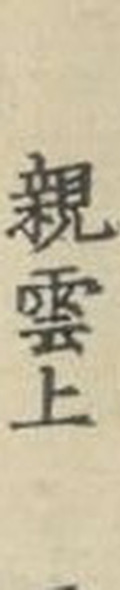親雲上

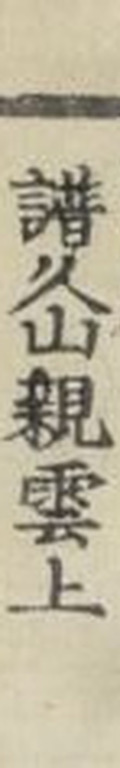譜久山親雲上
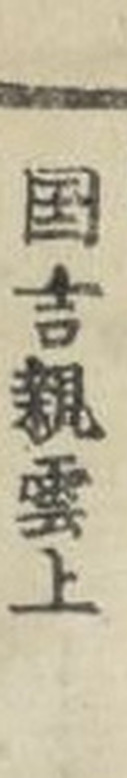国吉親雲上
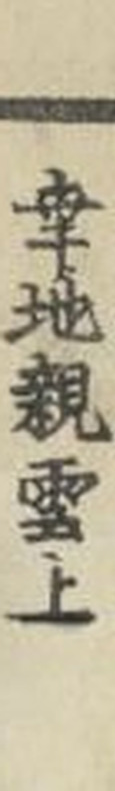幸地親雲上
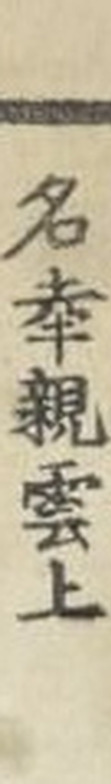名幸親雲上
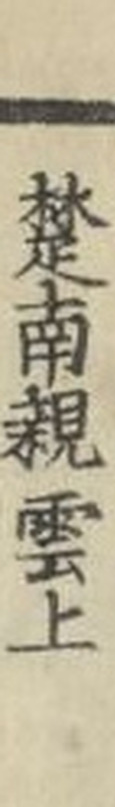楚南親雲上
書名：琉球解語
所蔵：University of the Ryukyus Library
